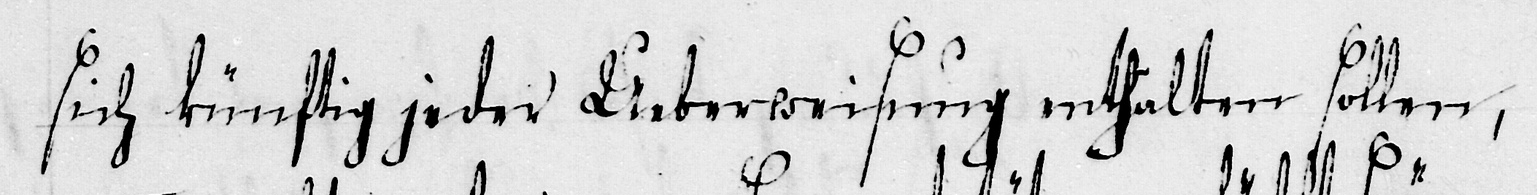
sich künftig jeder Ueberweisung enthalten sollen,
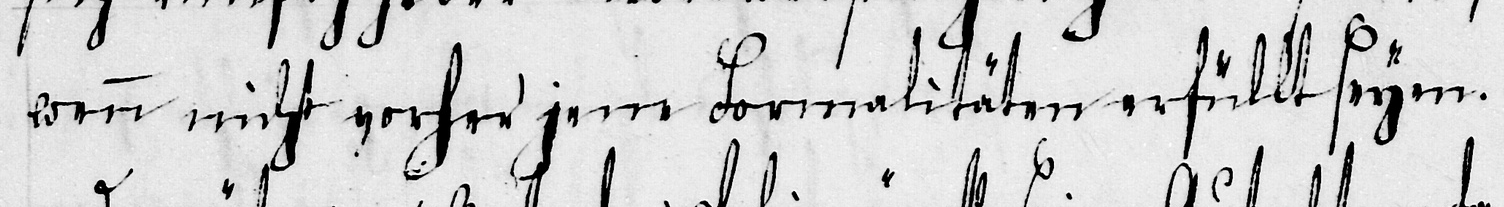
wenn nicht vorher jene Formalitäten erfüllt seyen.
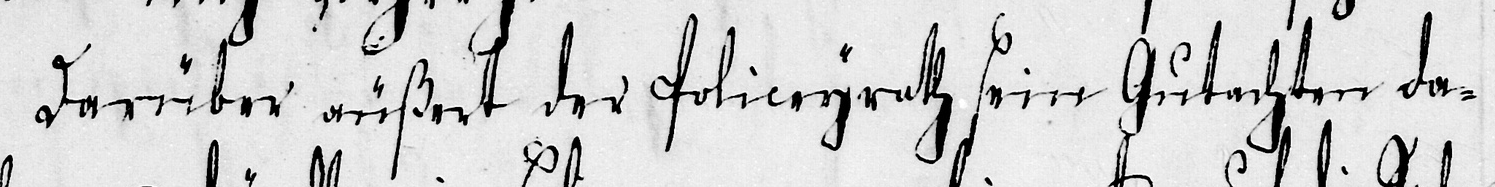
Darüber äußert der Policeyrath sein Gutachten da¬
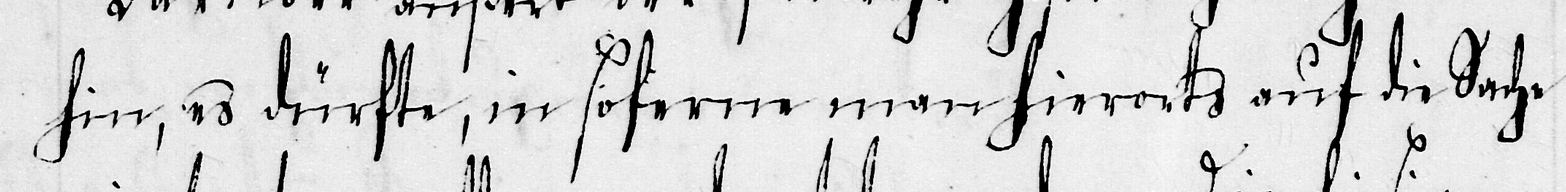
hin, es dürfte, in soferne man hierorts auf die Sache
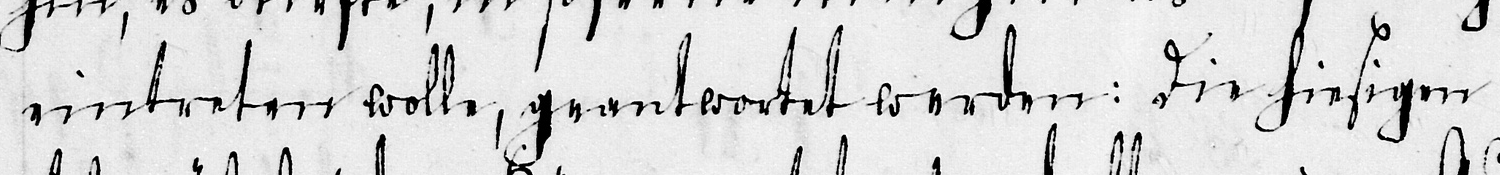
eintreten wolle, geantwortet werden: Die hiesigen
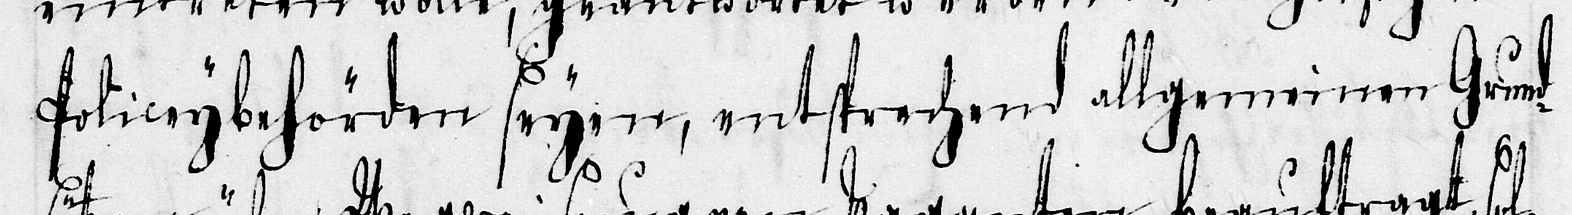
Policeybehörden seyen, entsprechend allgemeinen Grun¬
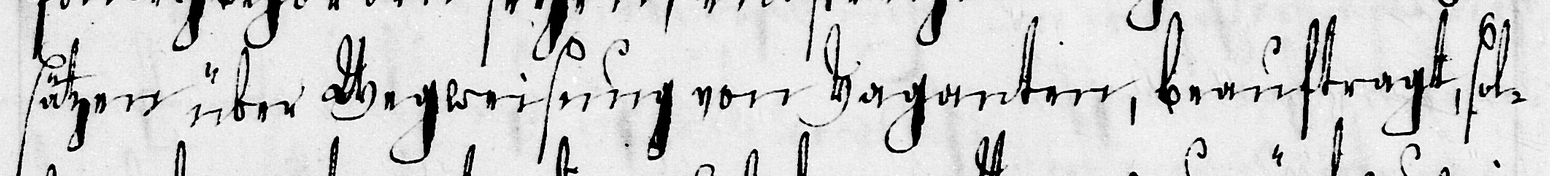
sätzen über Wegweisung von Vaganten, beauftragt, sol¬
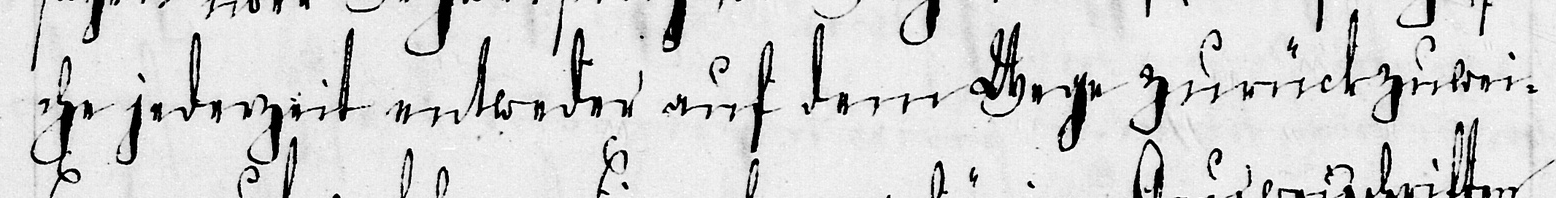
che jederzeit entweder auf dem Wege zurückzuwei¬
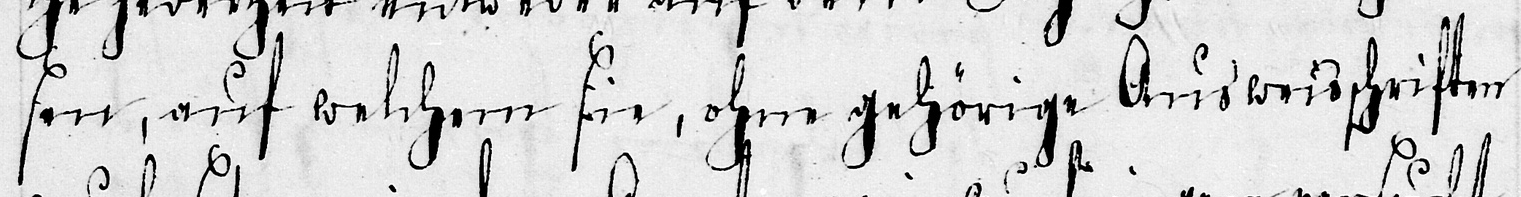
sen, auf welchem sie, ohne gehörige Ausweisschriften
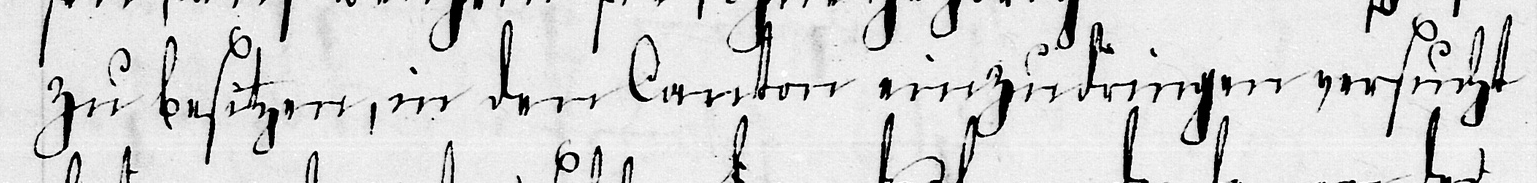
zu besitzen, in den Canton einzudringen versucht
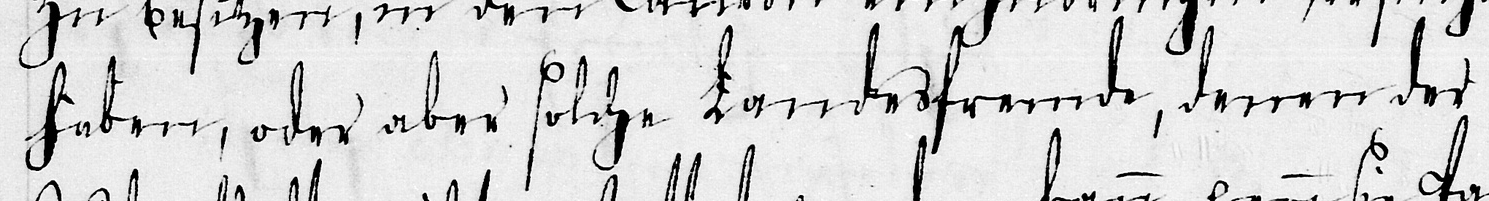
haben, oder aber solche Landesfremde, denen der
